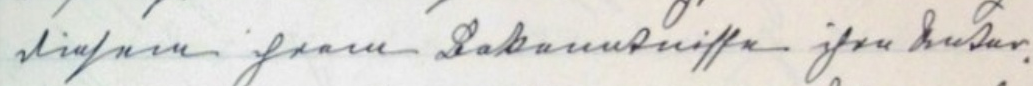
diesem ihrem Bekenntnisse ihre Unter
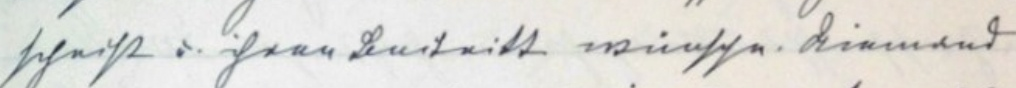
Unterschrift u. ihren Beitritt wünsche. Niemand
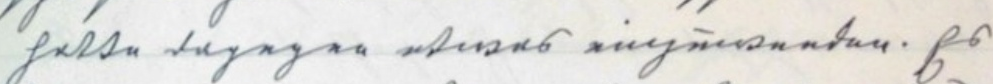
hatte dagegen etwas einzuwenden. Es
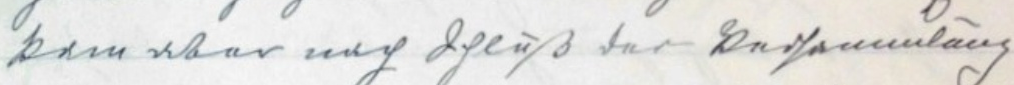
kam aber nach Schluß der Versammlung
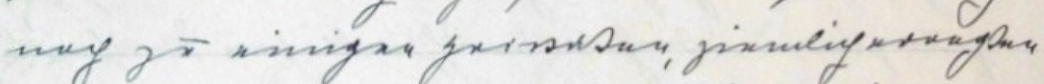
noch zu einigen privaten, ziemlich erregten
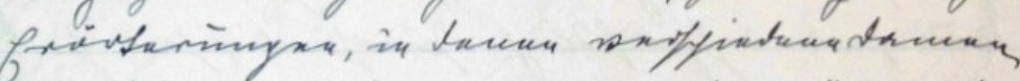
Erörterungen, in denen verschiedene Damen
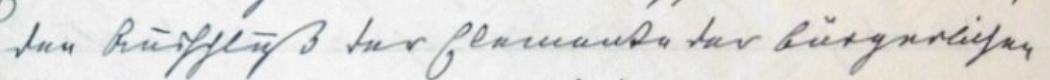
den Ausschluß der Elemente der bürgerlichen
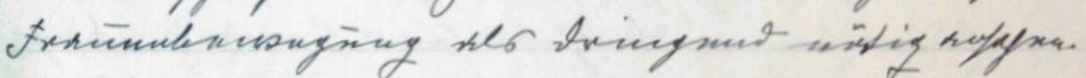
Frauenbewegung als dringend nötig ersahen
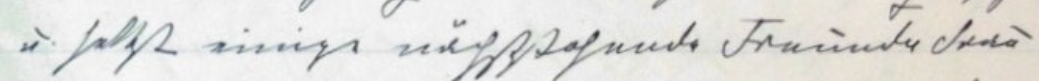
u. selbst einige nächstehende Freunde Frau
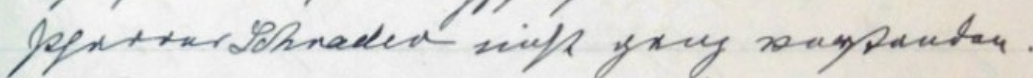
Pfarrer Schrader nicht ganz verstanden.
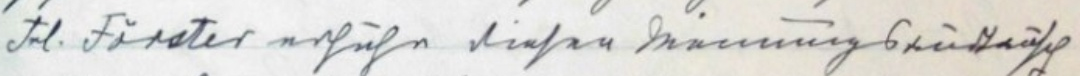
Frl. Förster erfuhr diesen Meinungsaustausch
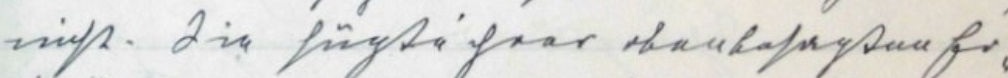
nicht. Sie fügte ihrer oben besagten Er
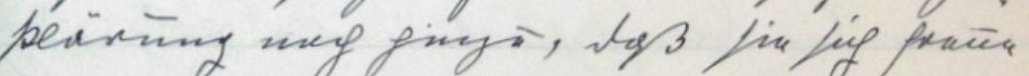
Erklärung noch hinzu, daß sie sich freue
